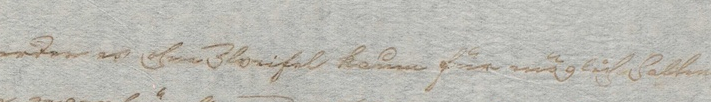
werden es ohne Zweifel kaum für möglich halten,
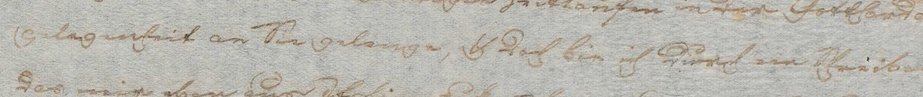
gelegenheit an Sie gelange, & doch bin ich durch ein Schreiben,
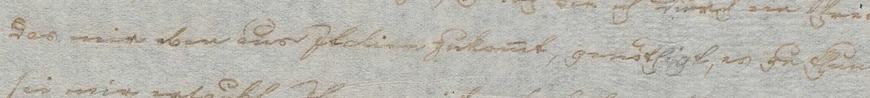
das mir eben aus Italien zukommt, genöthigt, es zu thun.
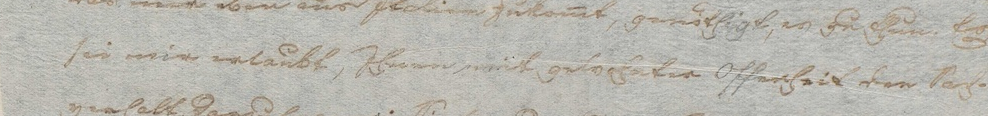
sei mir erlaubt, Ihnen mit gewohnter Offenheit den Sach-
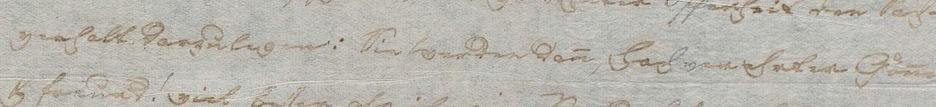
verhalt darzulegen: Sie werden dann, hochverehrten Gönner
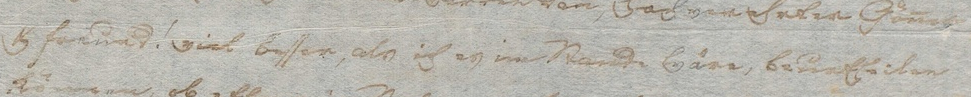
& Freund! viel besser, als ich es im Stande wäre, beurtheilen
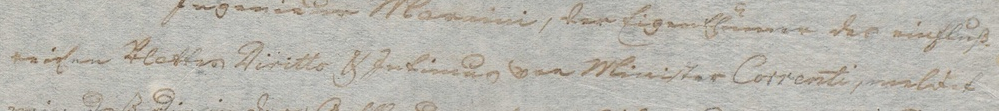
reichen Blattes Diritto & Intimus von Minister Correnti, meldet
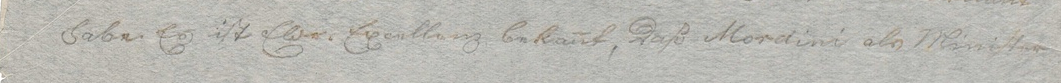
habe. Es ist Ewr. Excellenz bekannt, daß Mordini als Minister
